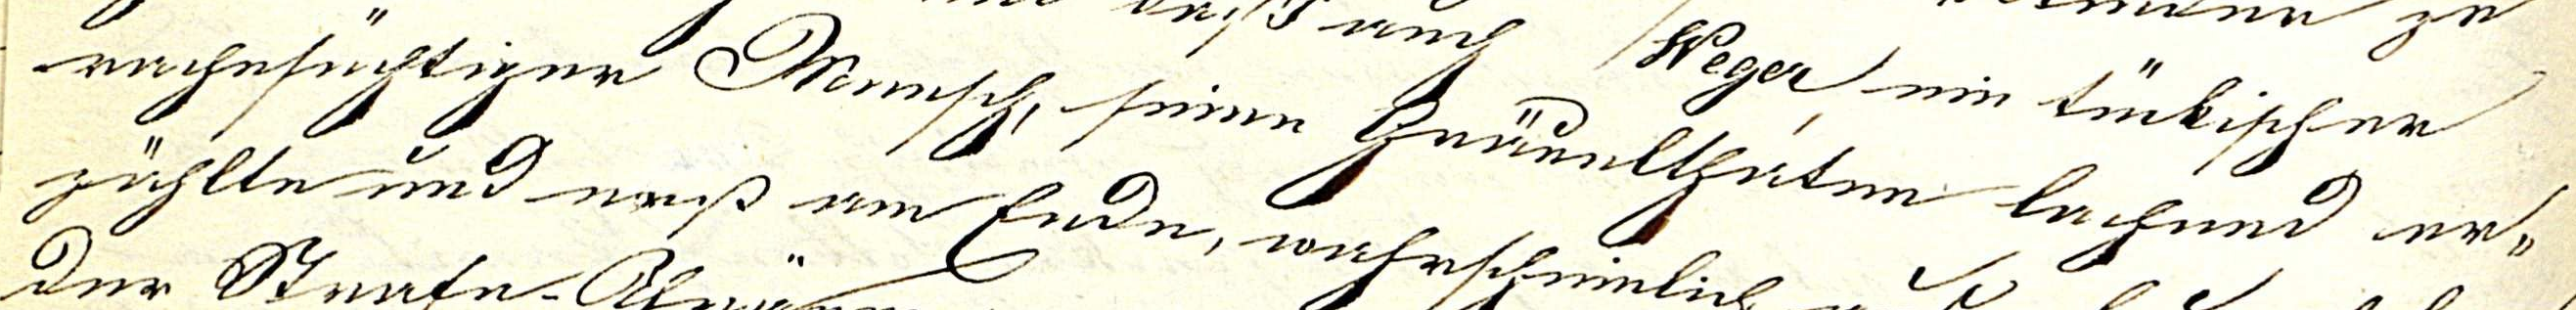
rachesüchtiger Mensch, seine Gräuelthaten lachend er¬
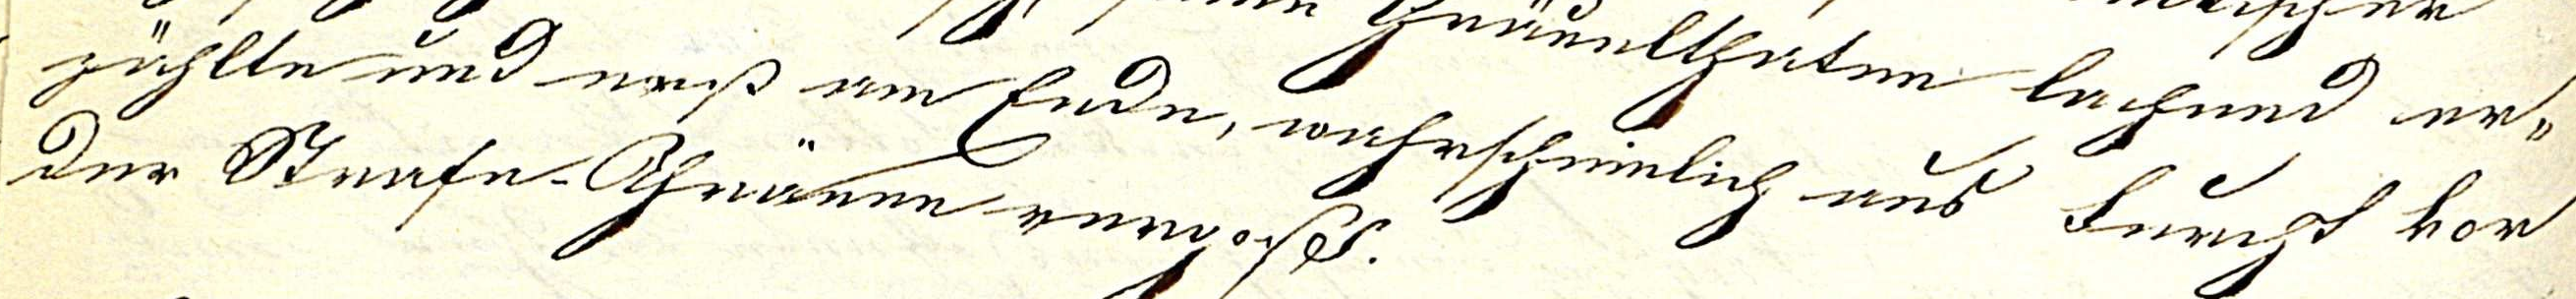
zählte und erst am Ende, wahrscheinlich aus Furcht vor
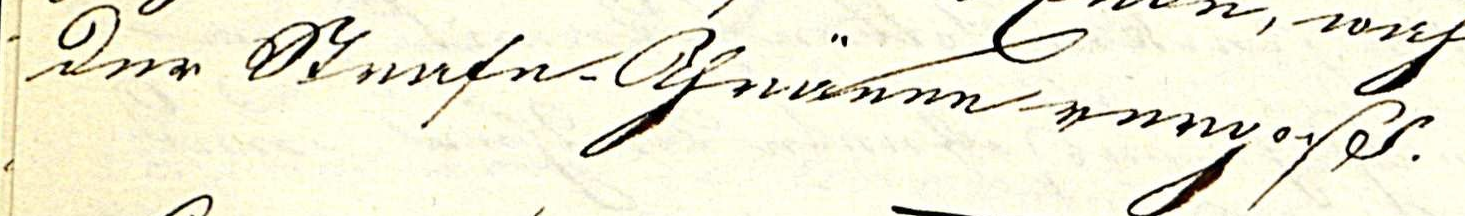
der Strafe, Thränen vergoß.
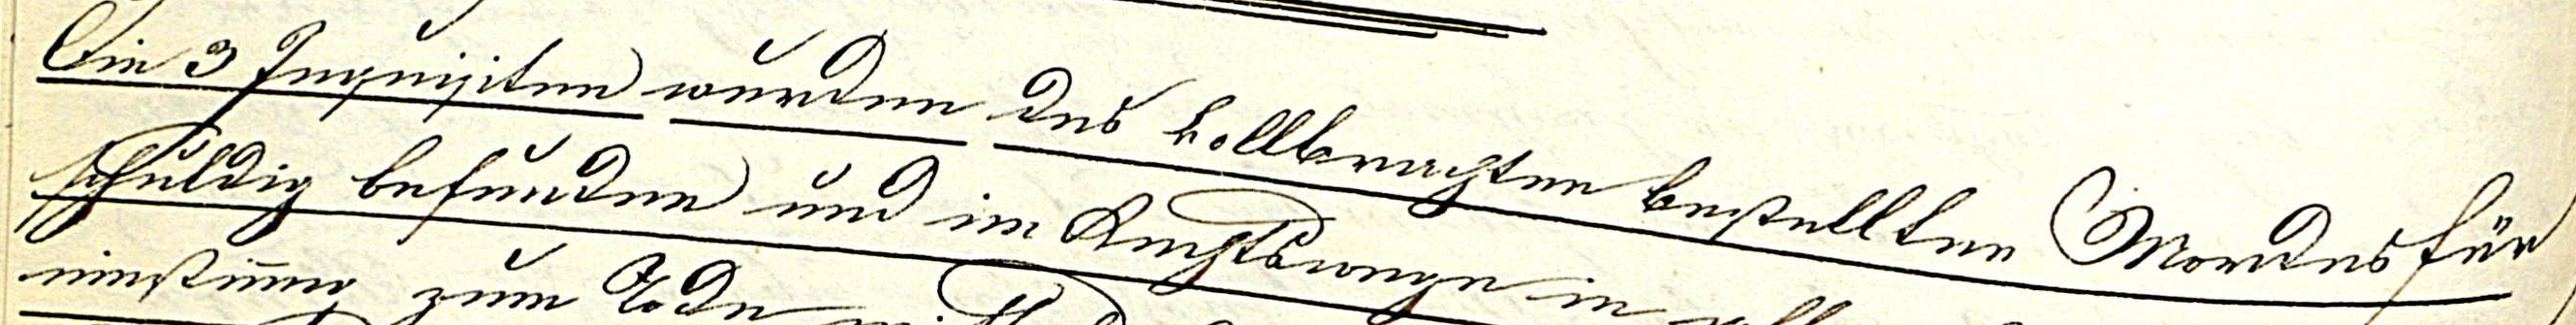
Die 3 Inquisiten wurden des vollbrachten bestellten Mordes für
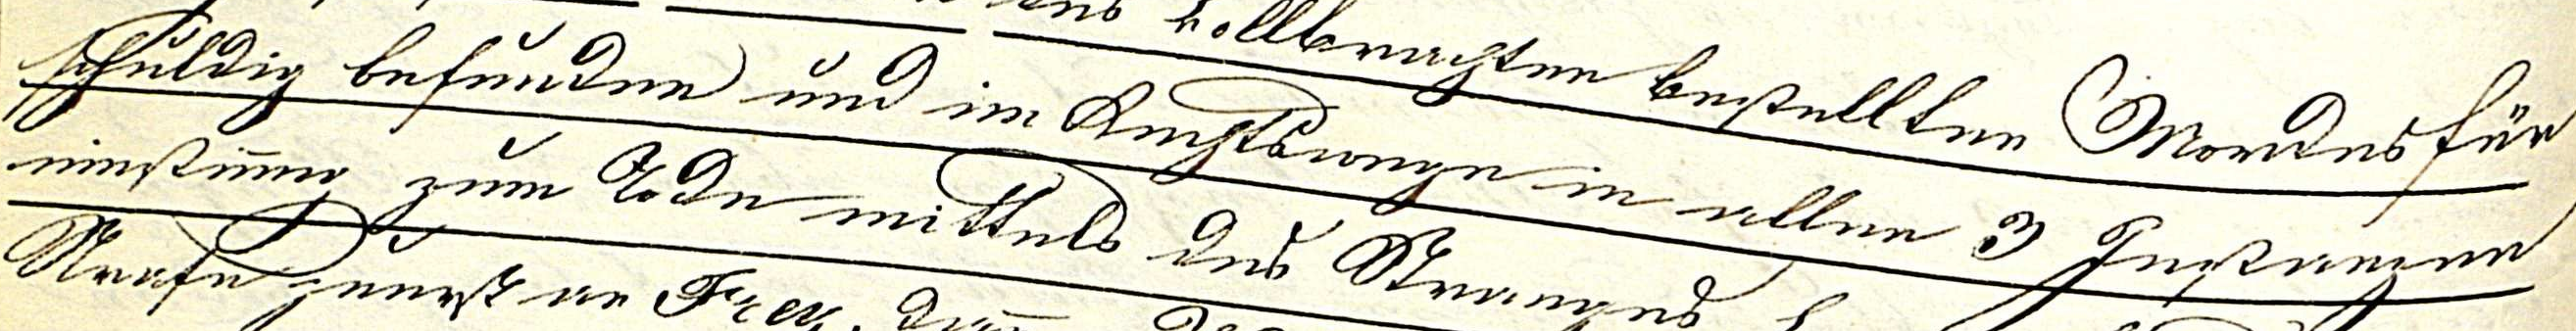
schuldig befunden und im Rechtswege in allen 3 Instanzen
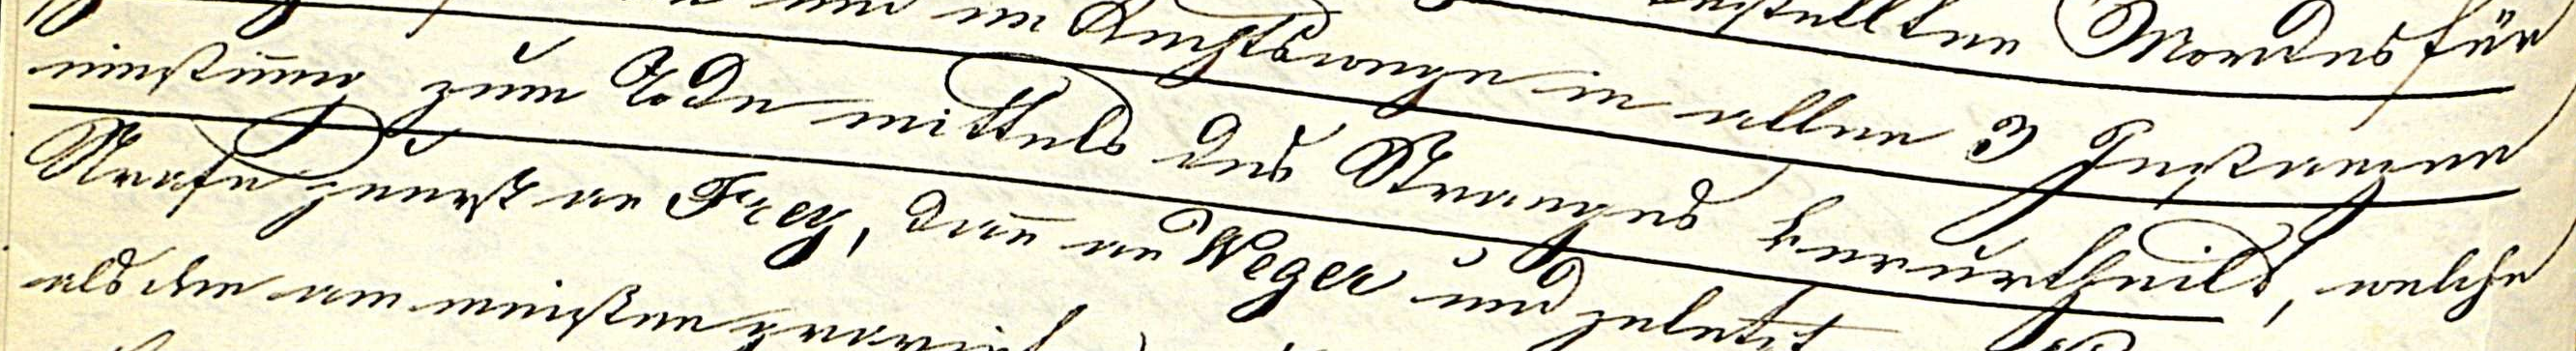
einstimmig zum Tode mittels des Stranges verurtheilt, welche
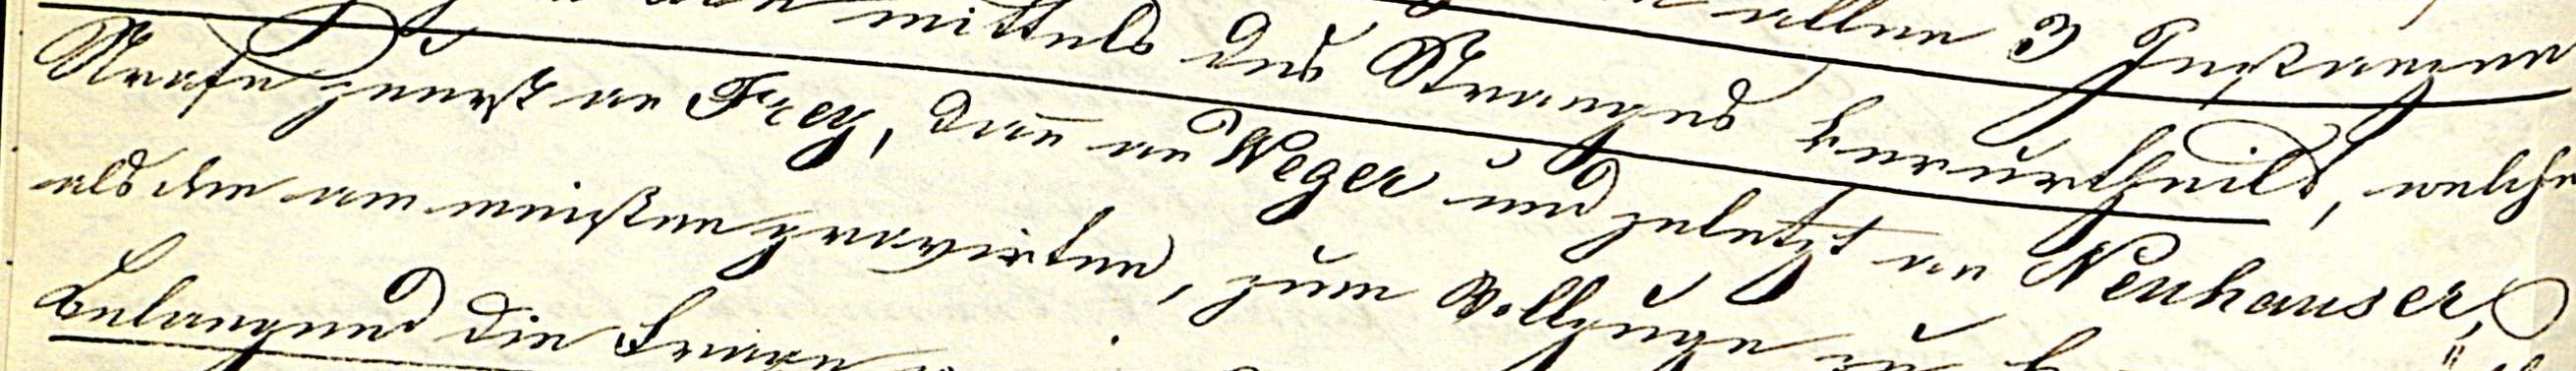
Strafe zuerst an Frey, dann an Weger und zuletzt an Neuhauser,
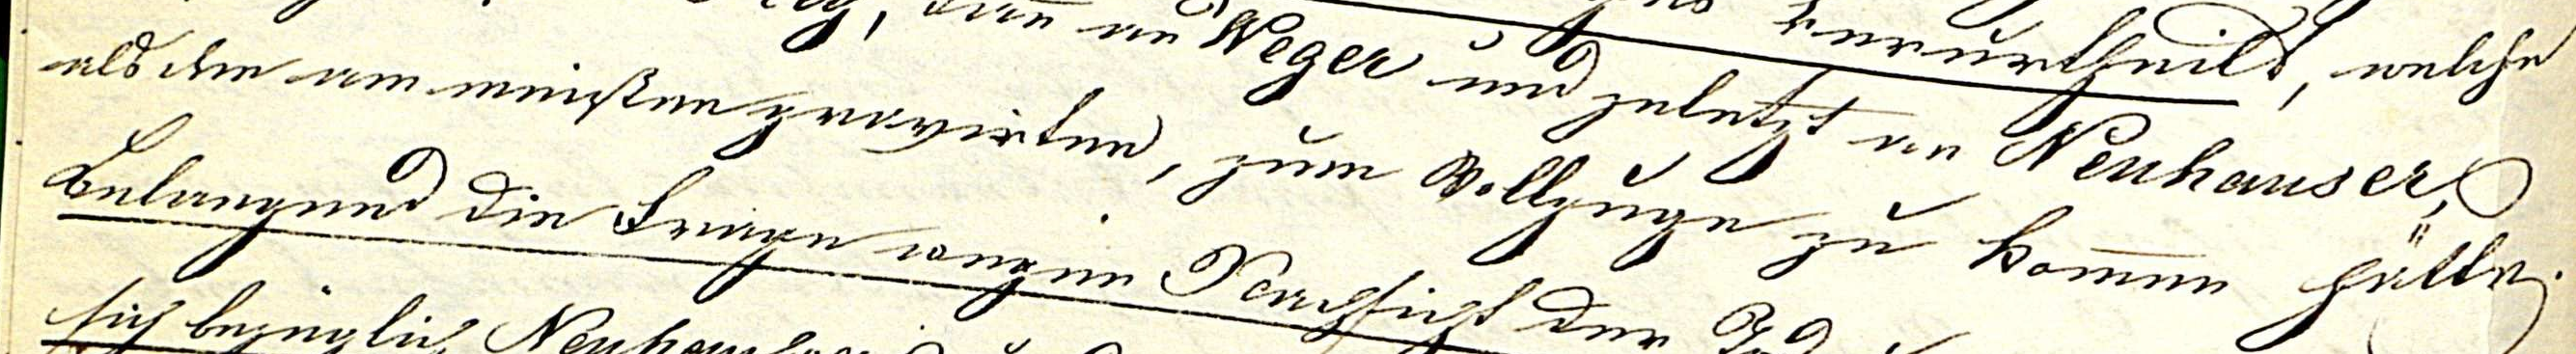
als der am meisten gravirten, zum Vollzuge zu kommen hätte.
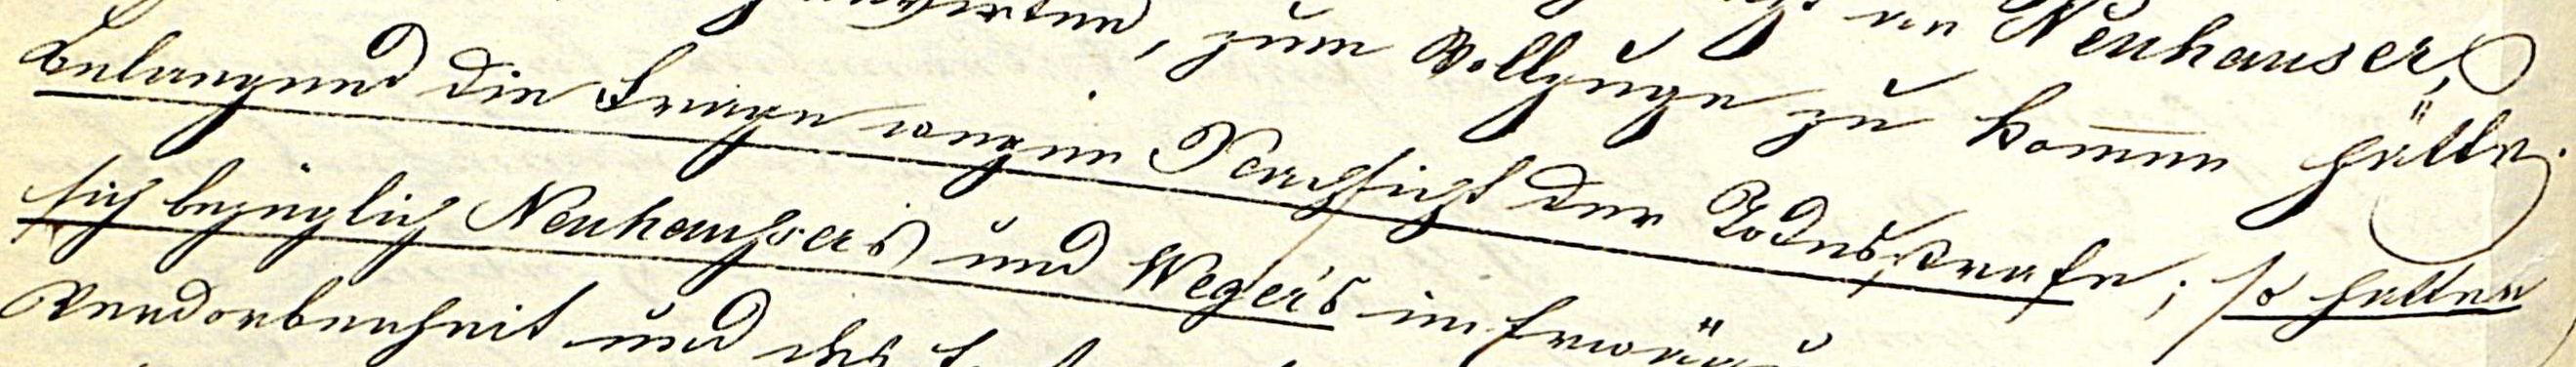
Belangend die Frage wegen Nachsicht der Todesstrafe; so hatten
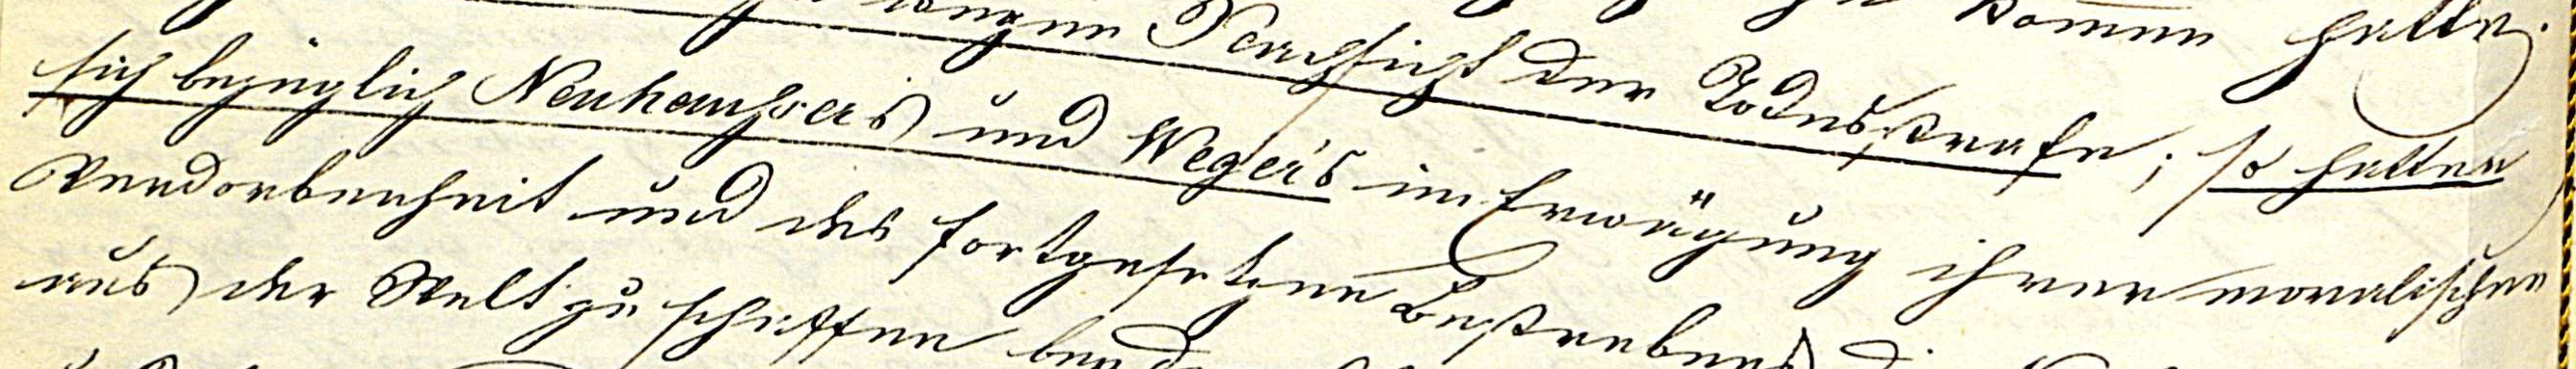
sich bezüglich Neuhausers und Wegers im Erwägung ihrer moralischen
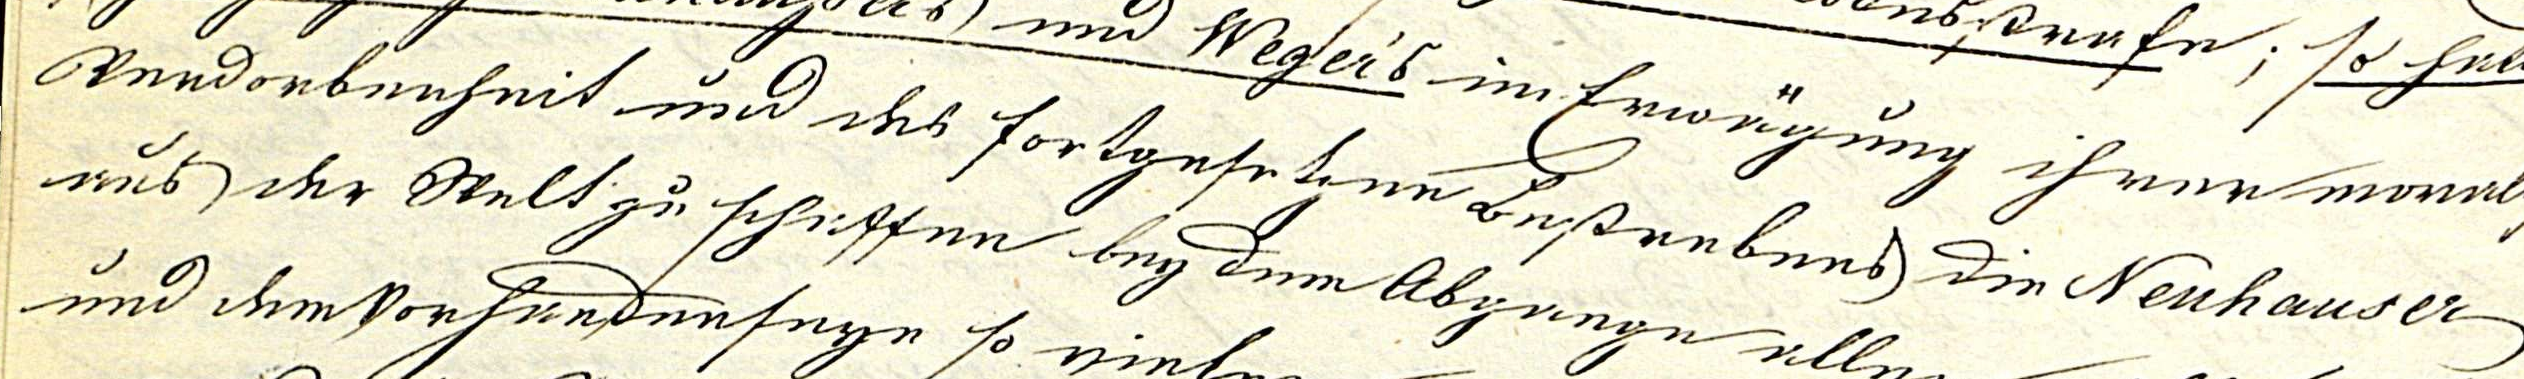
Verdorbenheit und des fortgesetzten Bestrebens die Neuhauser
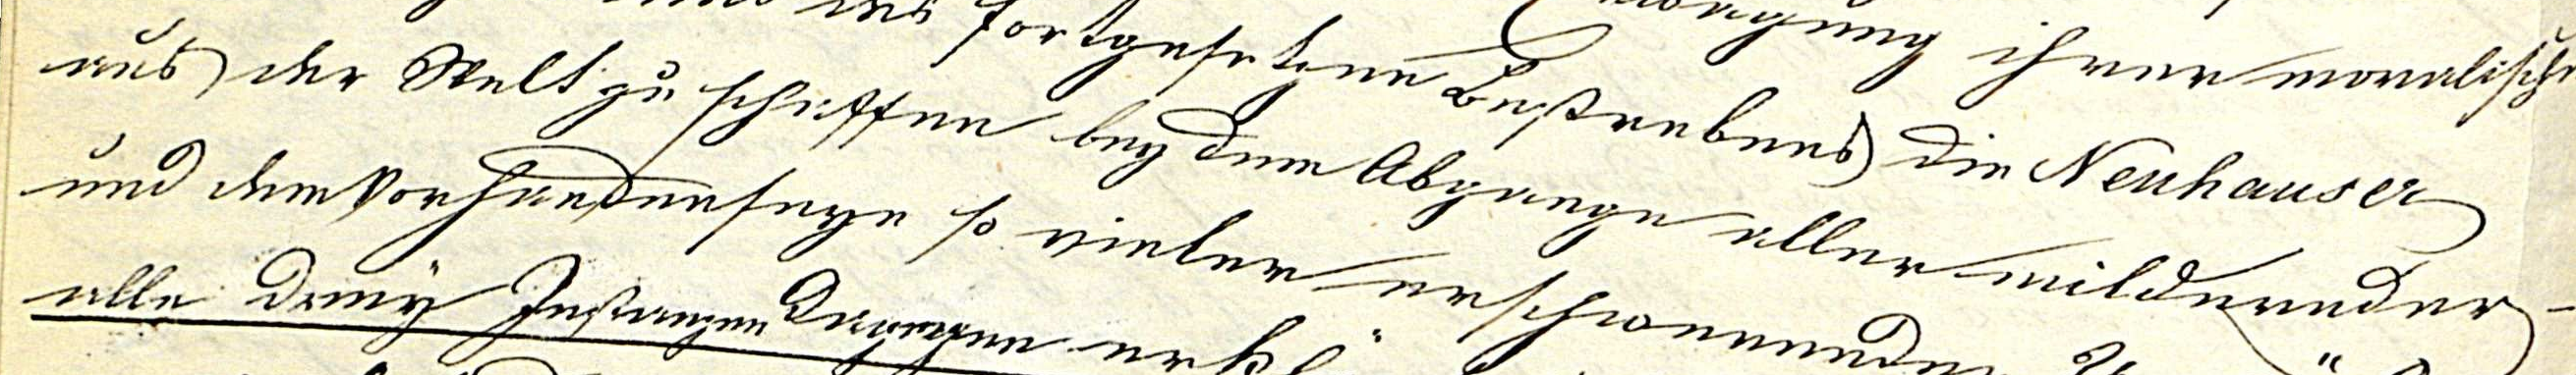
aus der Welt zu schaffen bey dem Abgange aller mildernder –
